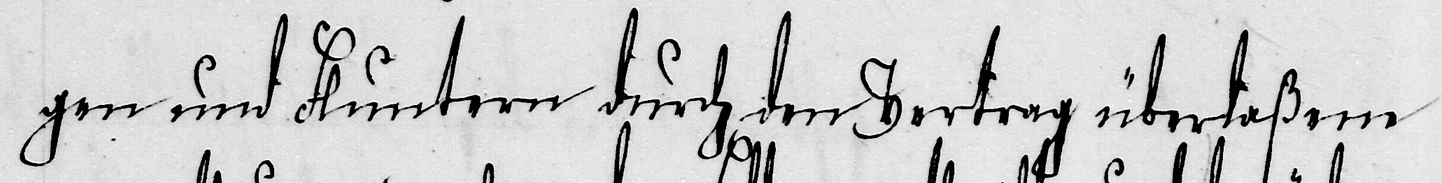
gen und Fluntern durch den Vertrag überlaßene
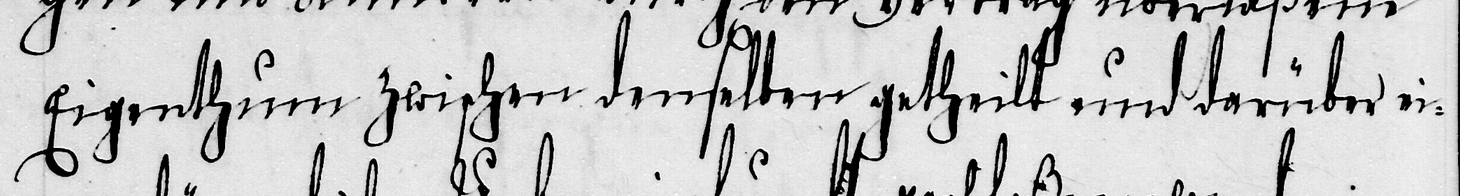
Eigenthum zwischen demselben getheilt und darüber ei¬
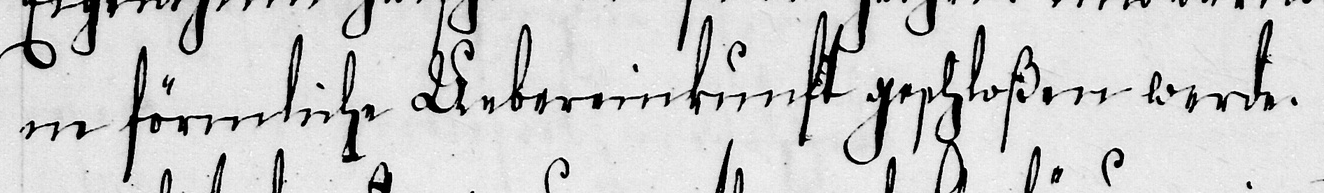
ne förmliche Uebereinkunft geschloßen werde.
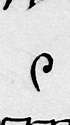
e.
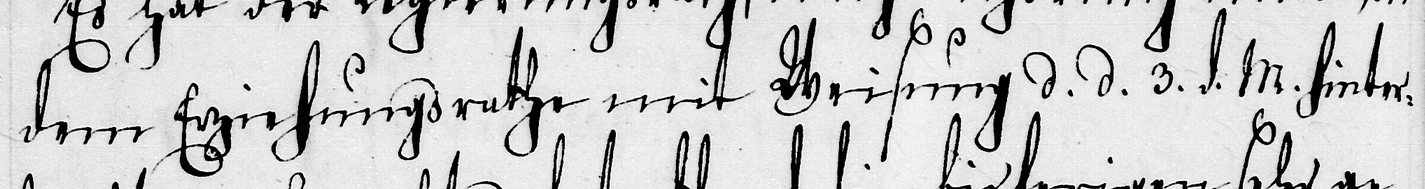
dem Erziehungsrathe mit Weisung d. d. 3. d. M. hint¬
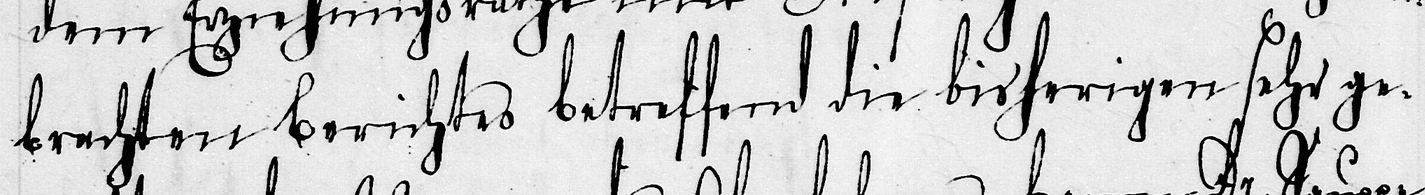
brachten Berichtes betreffend die bisherigen sehr ge¬
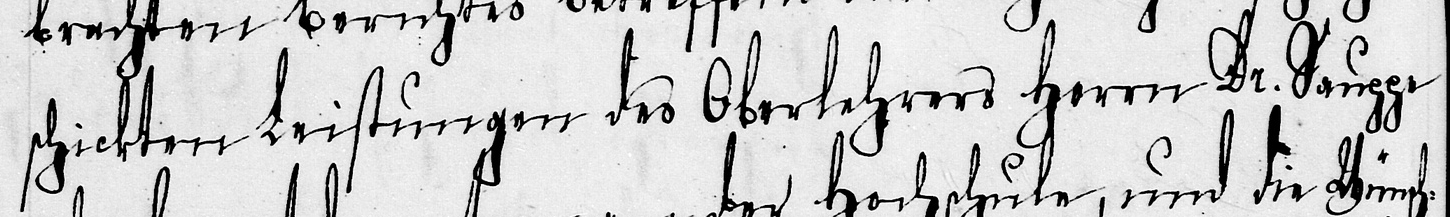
schickten Leistungen des Oberlehrers Herrn Dr. Saup¬
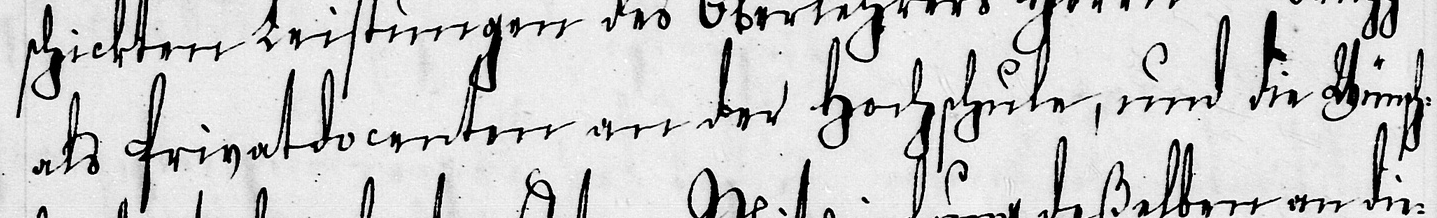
als Privatdocenten an der Hochschule, und die Wüns¬
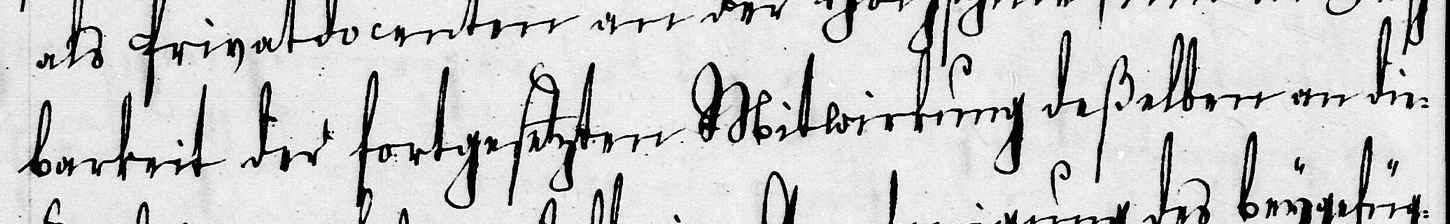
barkeit der fortgesetzten Mitwirkung deßelben an die¬
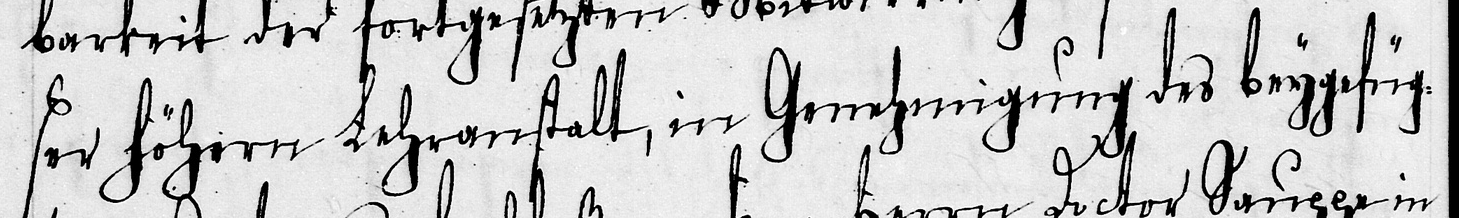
ser Höhern Lehranstalt, in Genehmigung des beygefüg¬
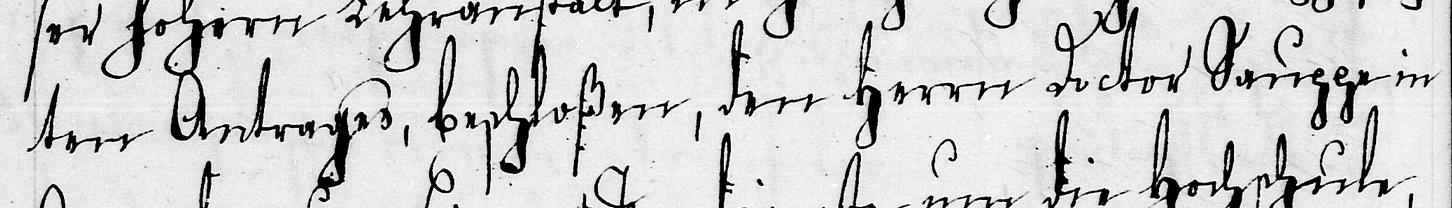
ten Antrages, beschloßen, den Herrn Doctor Sauppe in
